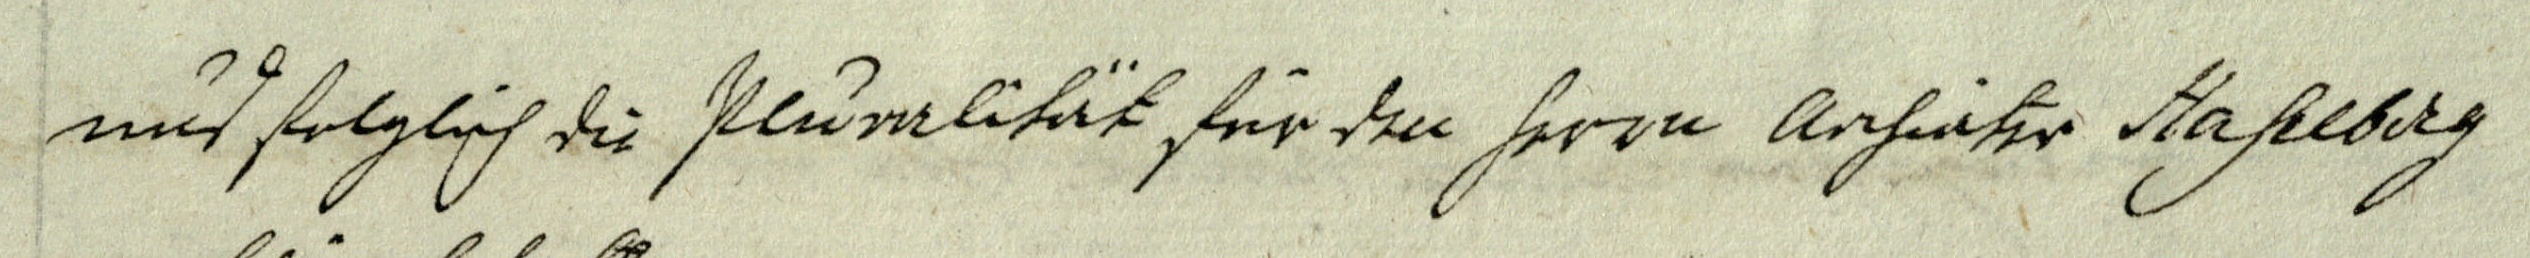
und folglich die Pluralität für den Herrn Archiater Haselberg
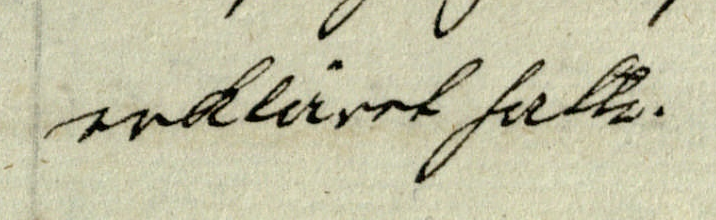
erkläret hatte.
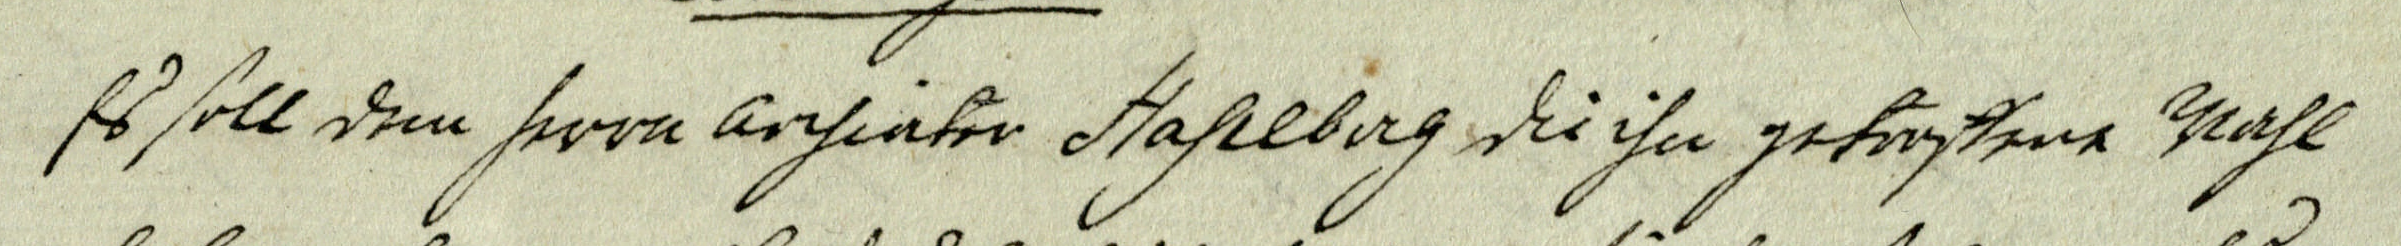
Es soll dem Herrn Archiater Haselberg die ihn getroffene Wahl
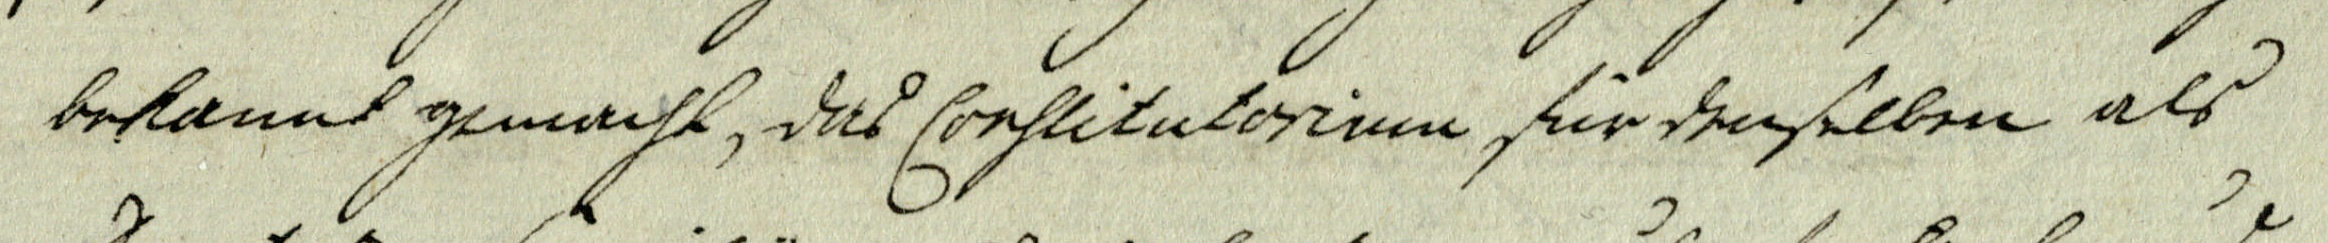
bekannt gemacht, das Constitutorium für denselben als
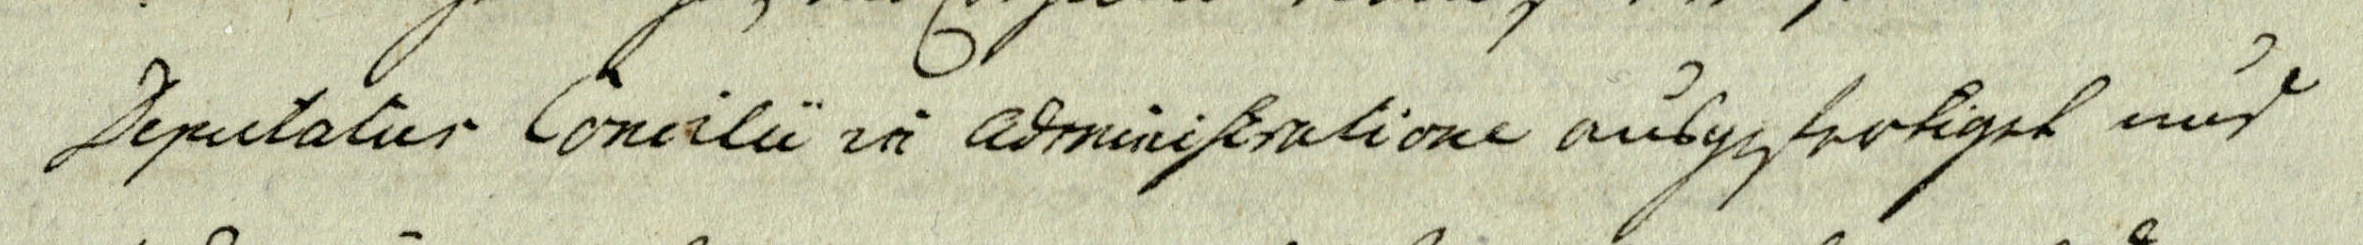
Deputatus Concilii in Administratione ausgefertiget und
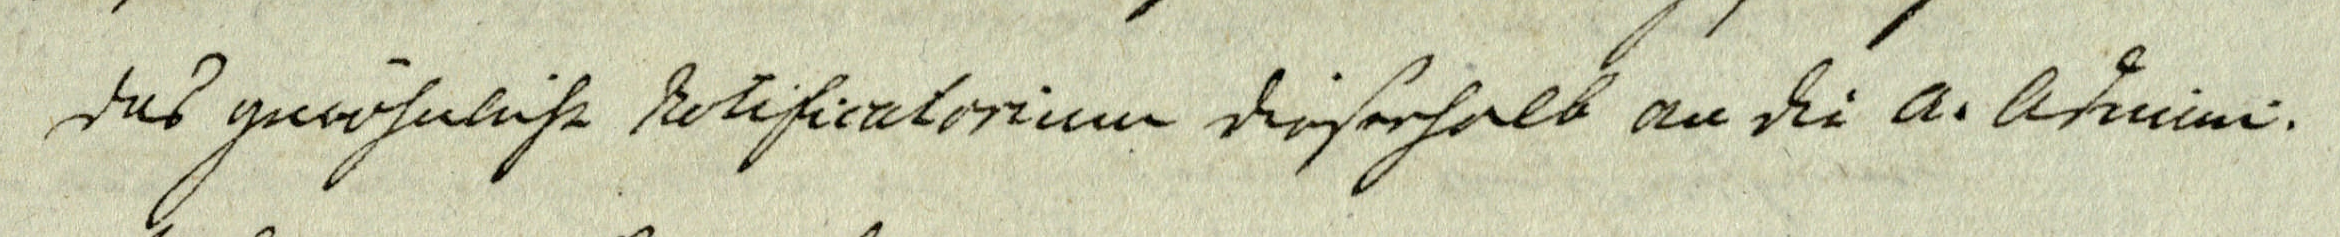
das gewöhnliche Notificatorium dieserhalb an die A. Admini¬
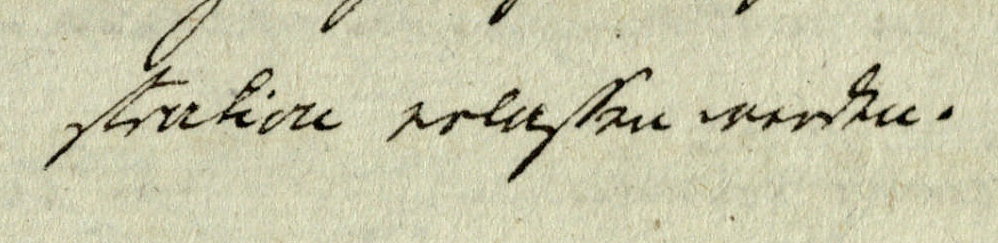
stration erlassen werden.
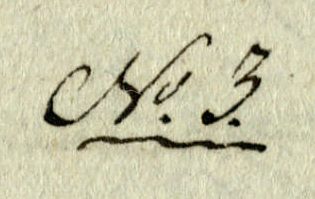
No 3.
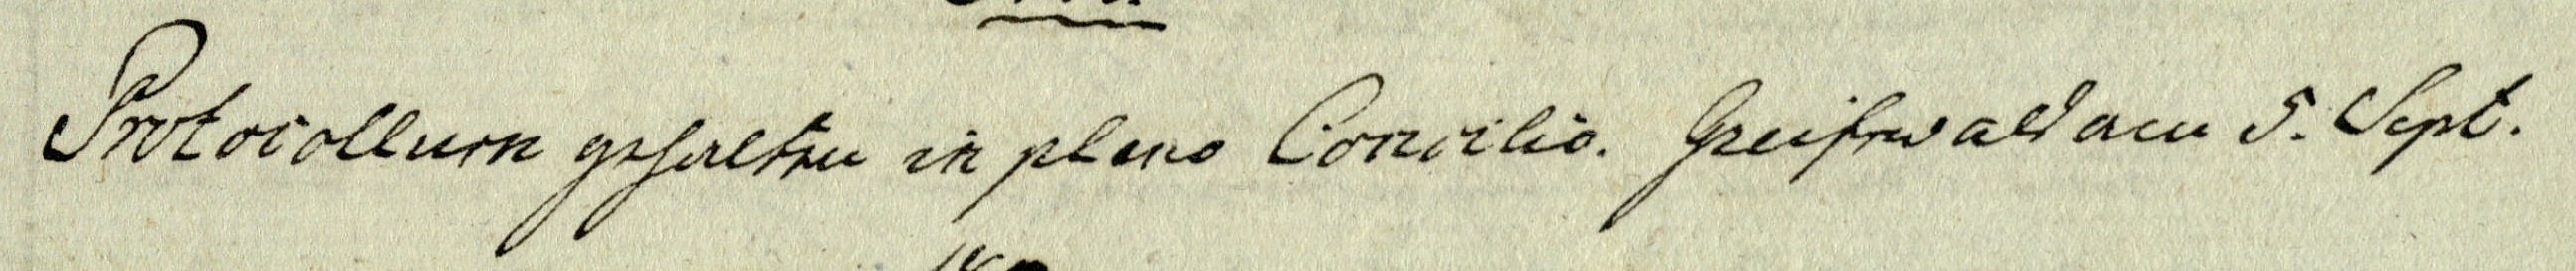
Protocollum gehalten in pleno Concilio. Greifswald am 5. Sept.
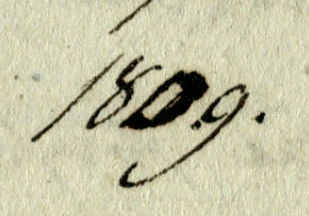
1809.
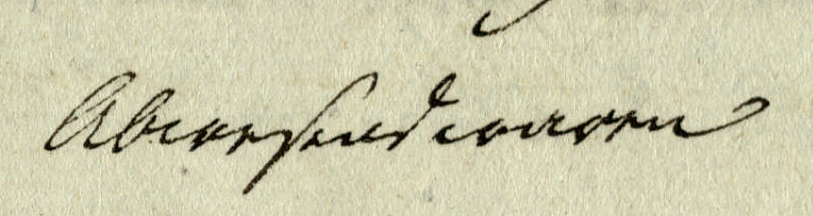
Abwesend waren
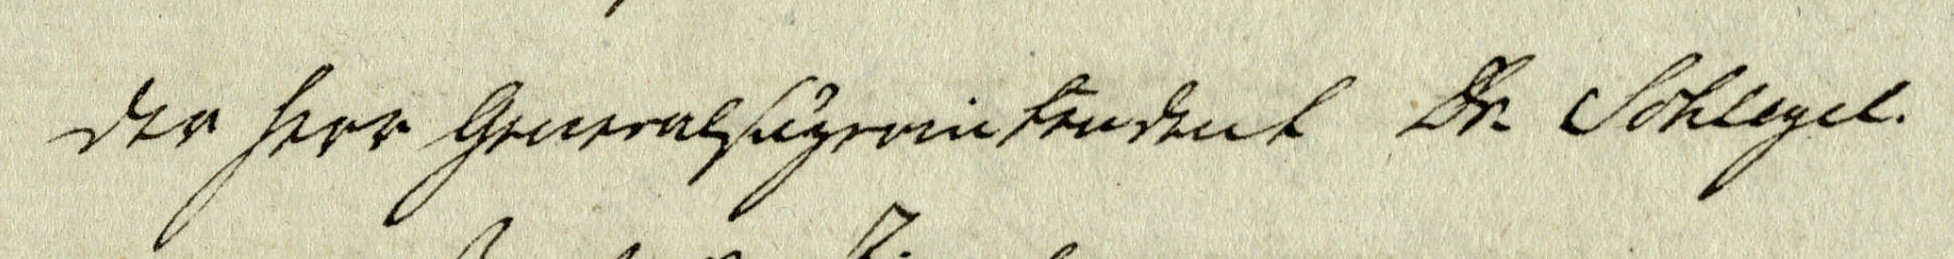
der Herr Generalsuperintendent Dr. Schlegel.
